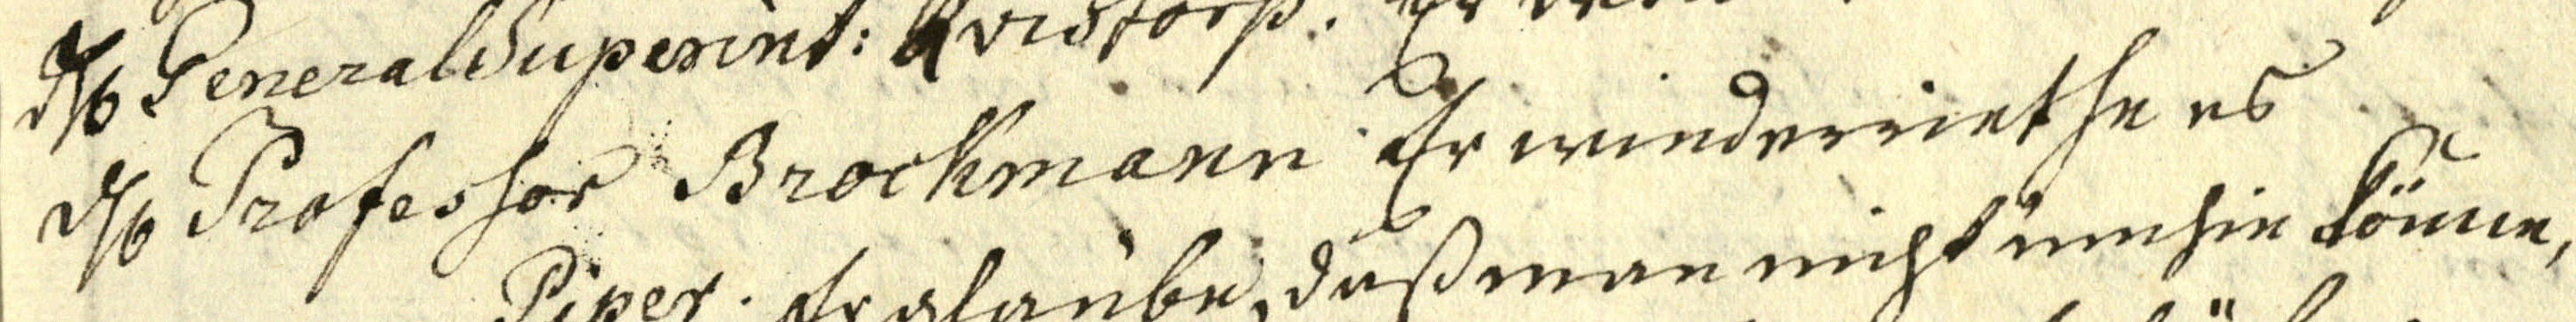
dh. Professor Brockmann. Er wiederriethe es.
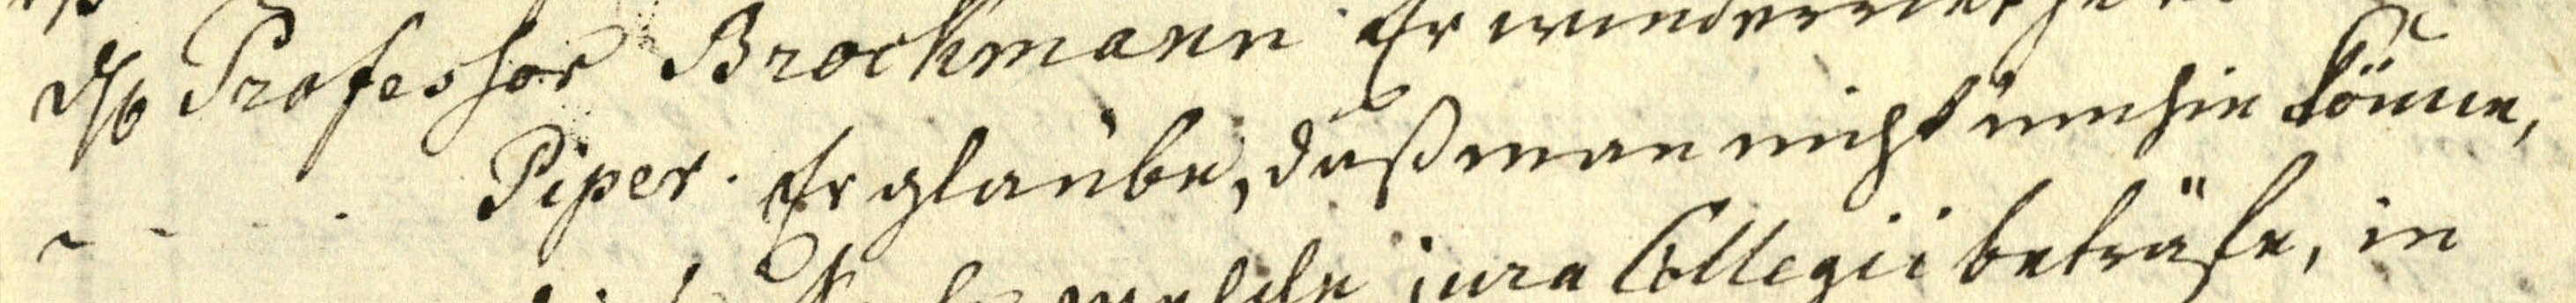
Piper. Er glaube, daß man nicht umhin könne,
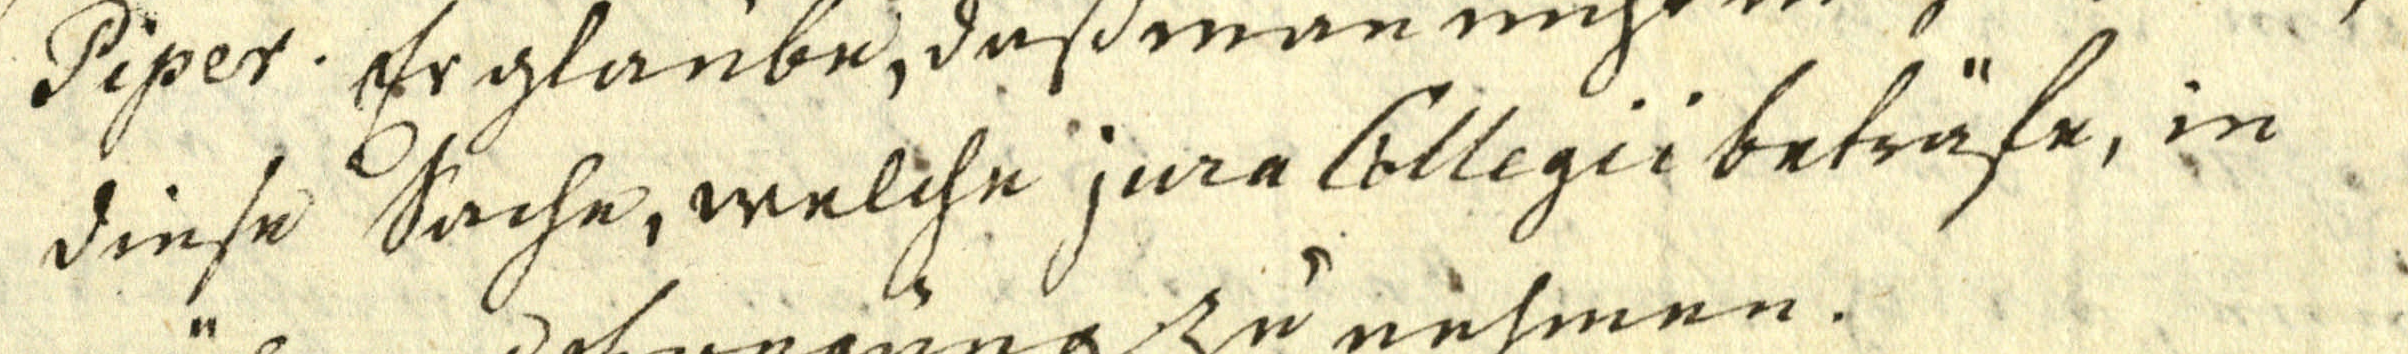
diese Sache, welche jura Collegii beträfe, in
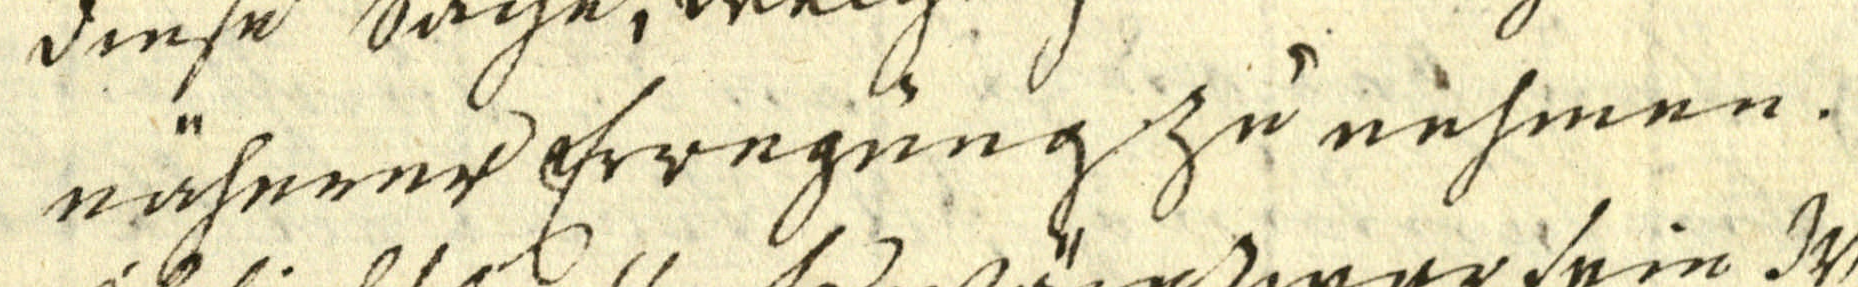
näherer Erwegung zu nehmen.
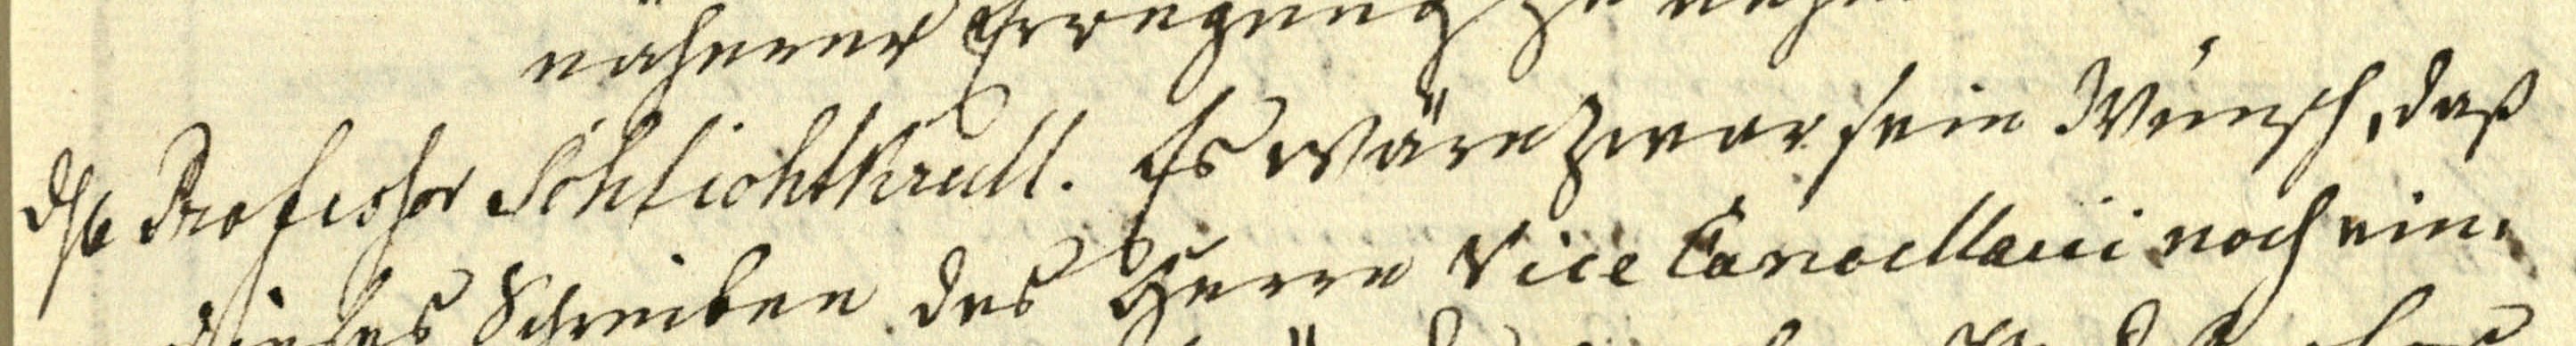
dh Professor Schlichtkrull. Es wäre zwar sein Wunsch, daß
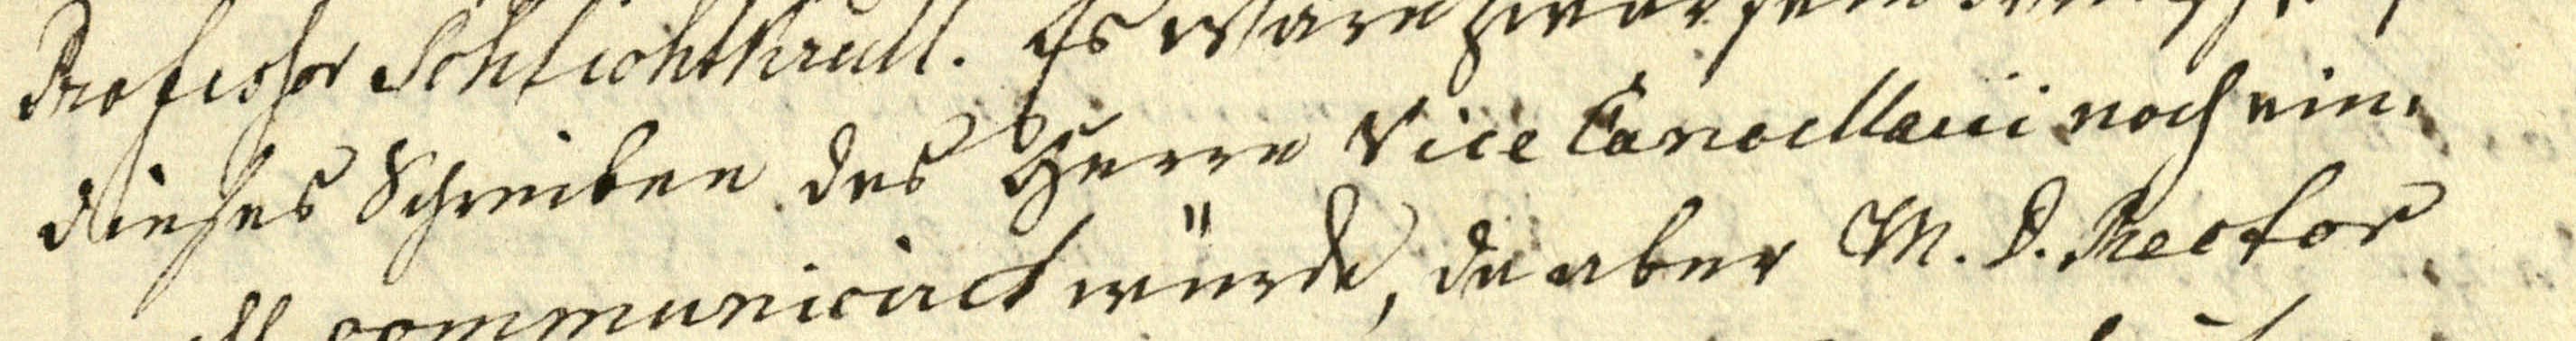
dieses Schreiben des Herrn Vice Cancellarii noch ein¬
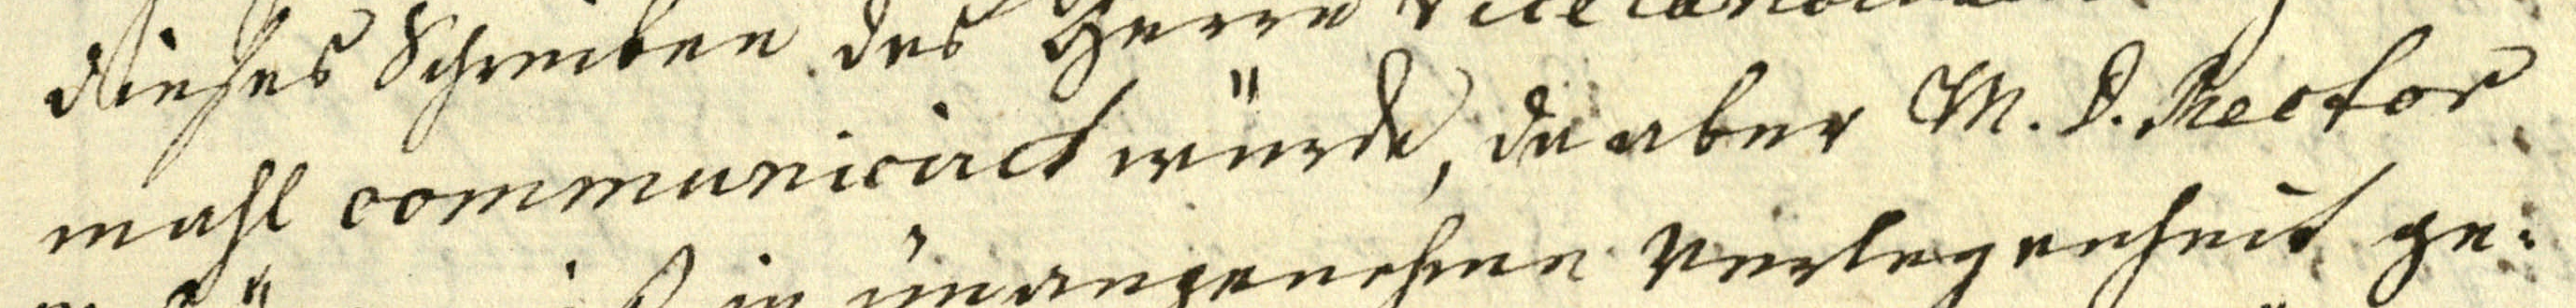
mahl communiciret würde, da aber M. D. Rector
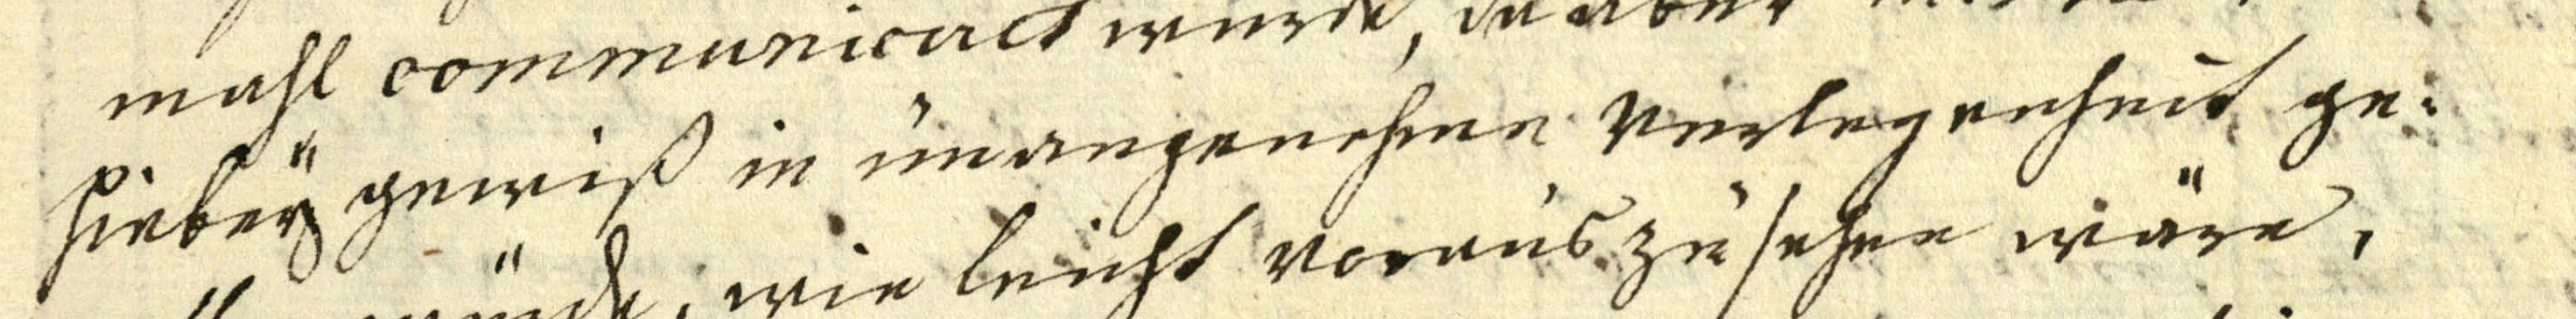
hiebeÿ gewiß in unangenehme Verlegenheit ge¬
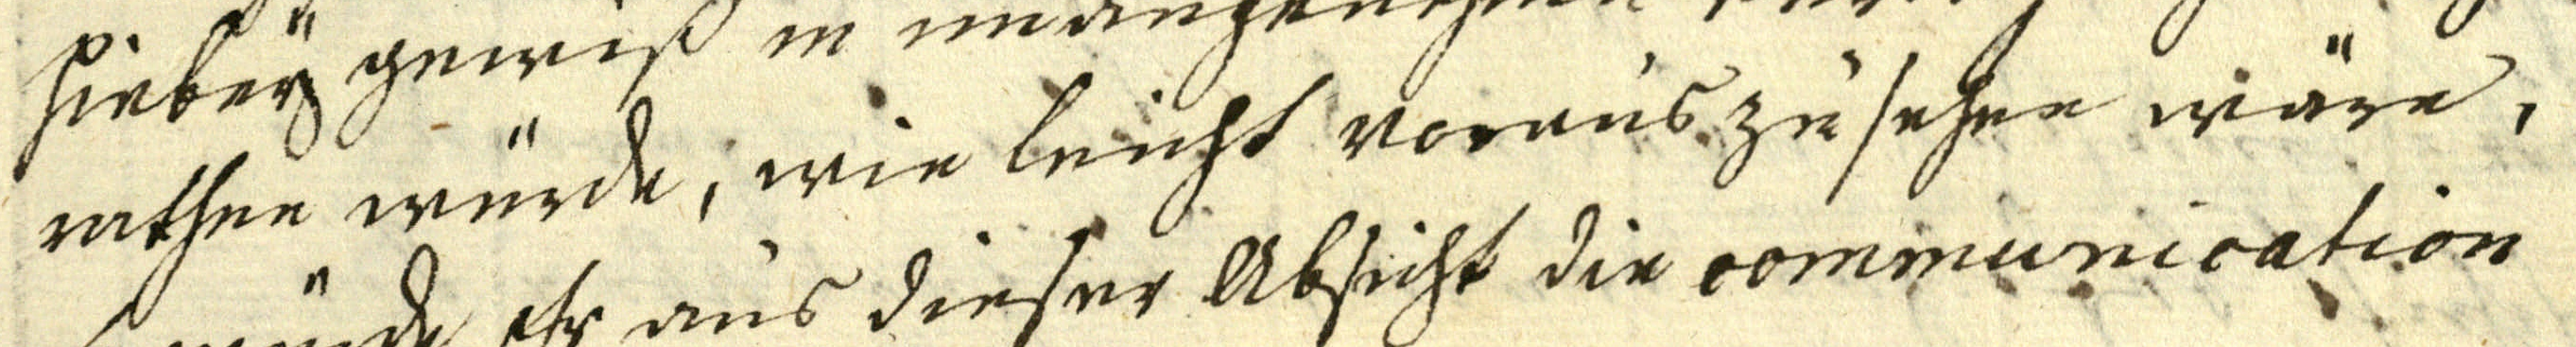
rathen würde, wie leicht voraus zu sehen wäre,
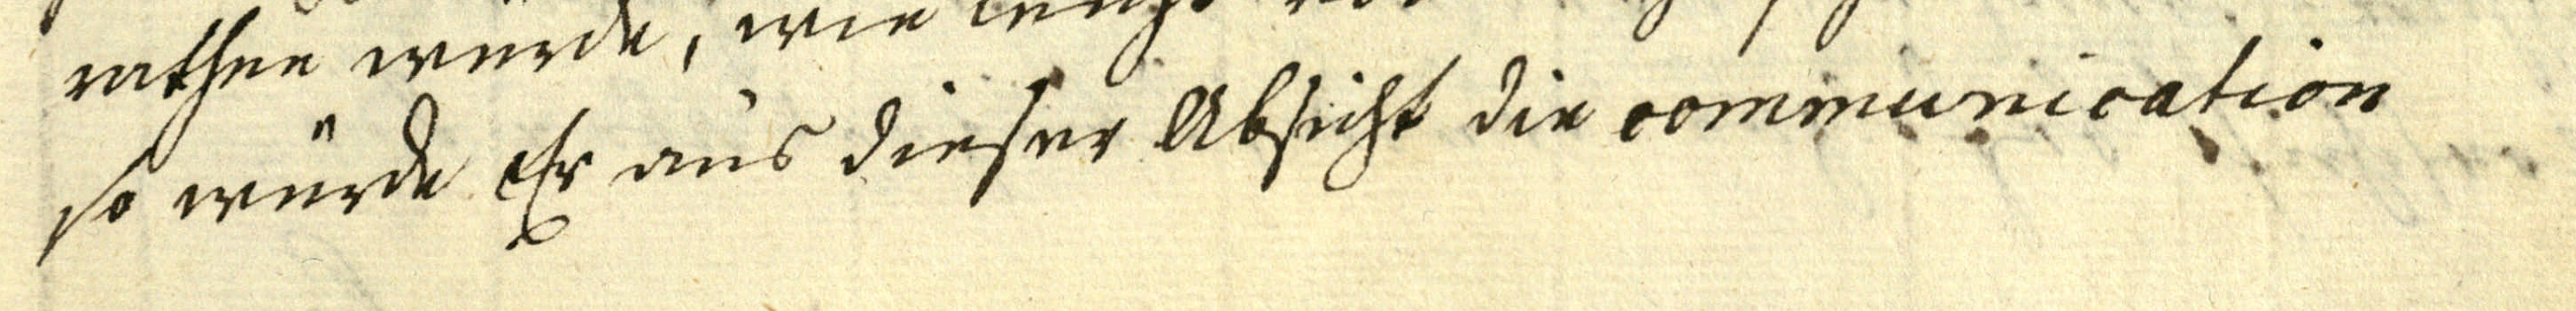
so würde Er aus dieser Absicht die communication
